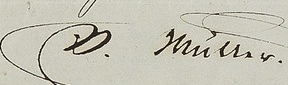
J J. Müller.
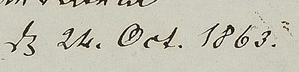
den 24. Oct. 1863
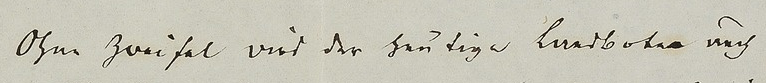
Ohne Zweifel wird der heutige Landbote auch
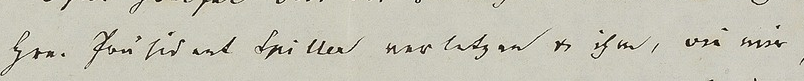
Hrn. Präsident Spiller verletzen & ihm, wie mir,
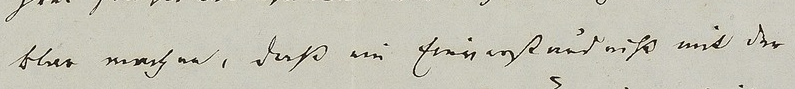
klar machen, daß ein Einverständniß mit der
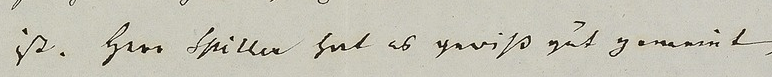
ist. Herr Spiller hat es gewiß gut gemeint
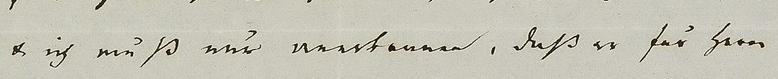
& ich muß nur anerkennen, daß er für Herrn
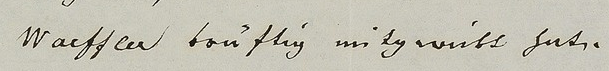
Waeffler kräftig mitgewirkt hat.
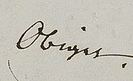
Obiger.
